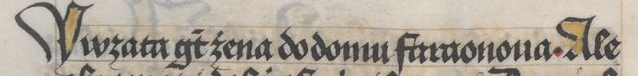Ywzata ḡt żena dodomu saraonona.Ale
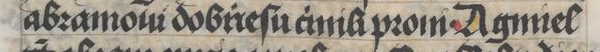abramoui dobṙie ſu ċinili proni. A gmiel
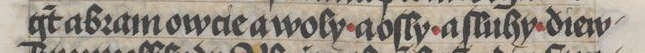ḡt abram owcie a woly.aoſly.a ſluhy.diew¬
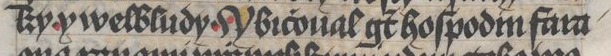ky y welbludy.Y bičoual ḡt hoſpodin fara¬
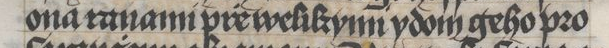ona ranami pṙewelikymi y dom geho pro¬
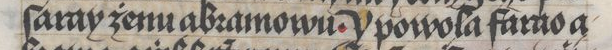ſaray żenu abramowu.Y powola farao a¬
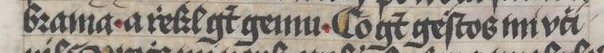brama.a ṙekl ḡt gemu.Co ḡt geẛtos mi vċi¬
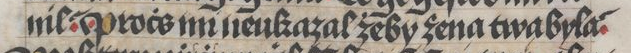nil? Proċs mi neukazal żeby żena twa byla?
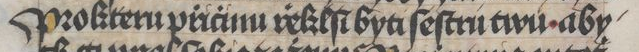Prokteru pṙiċinu ṙeklſi byti ſeſtru twú.aby¬
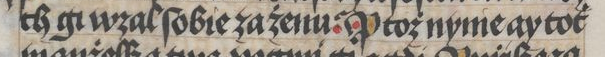ch gi wzal ſobie za żenu?Ꝓtoż nynie ay toť
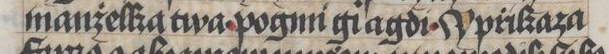manżelka twa.pogmi gi a gdi.Ypṙikaza¬
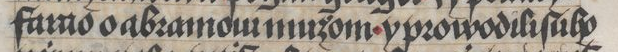farad o abramoui mużom.y prowodili ſu ho
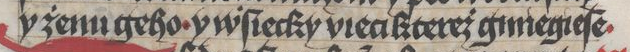y żenu geho.y wẛiecky vieci ktereż gmiegieẛe.
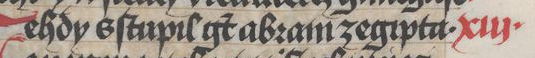Eehdy sſtupil ḡt abraní zegipta.xiij.
